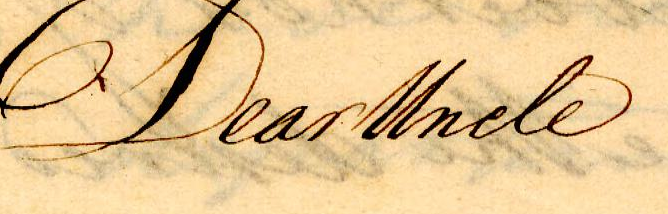Dear Uncle
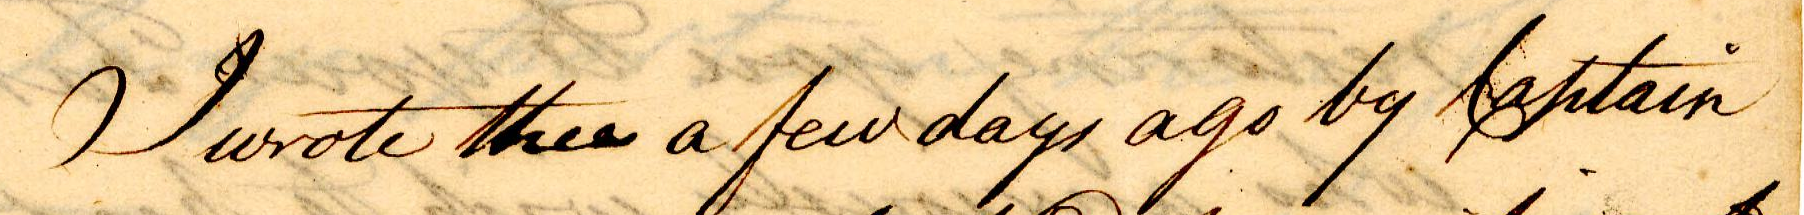I wrote thee a few days ago by Captain
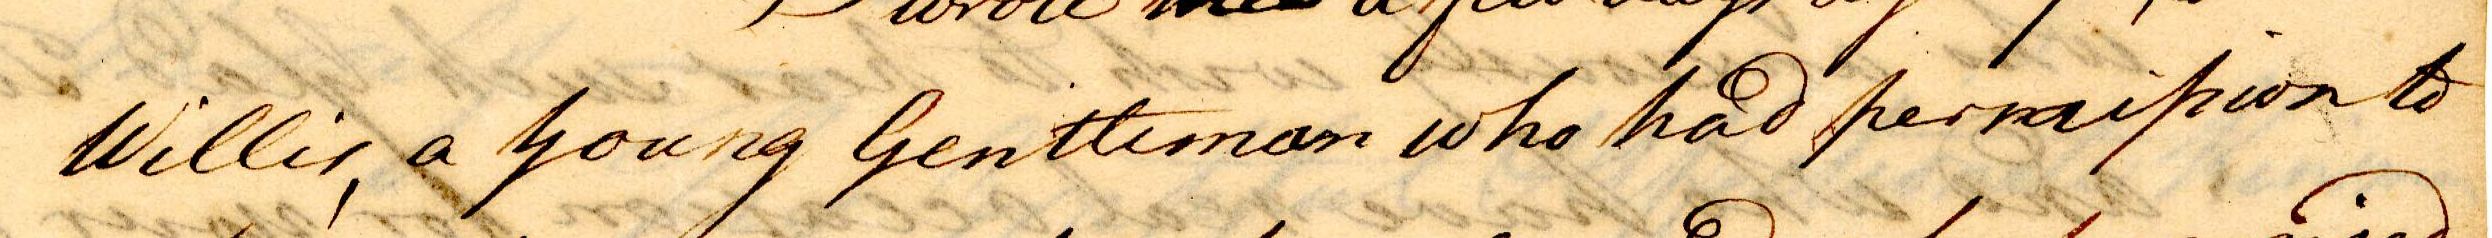Willis, a young Gentleman who had permission to
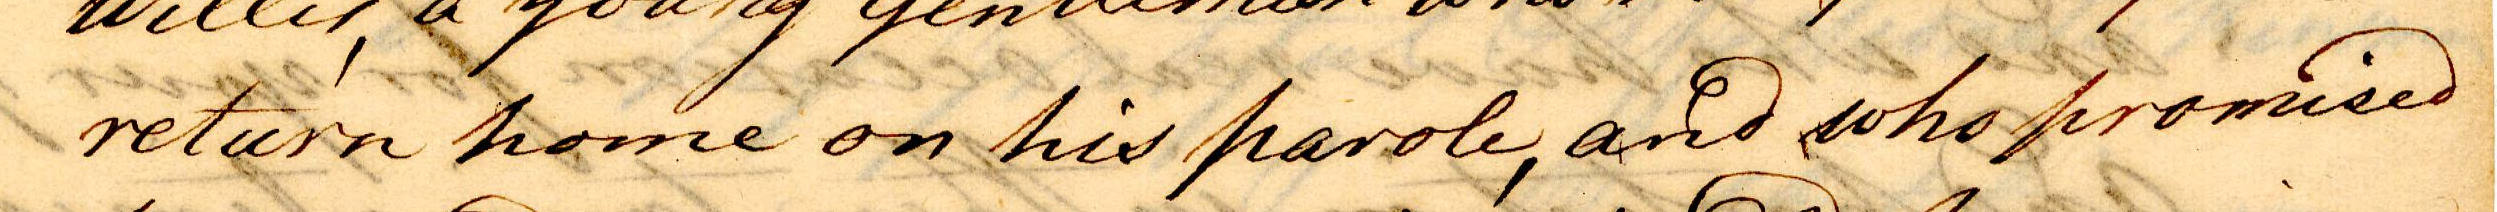return home on his parole, and who promised
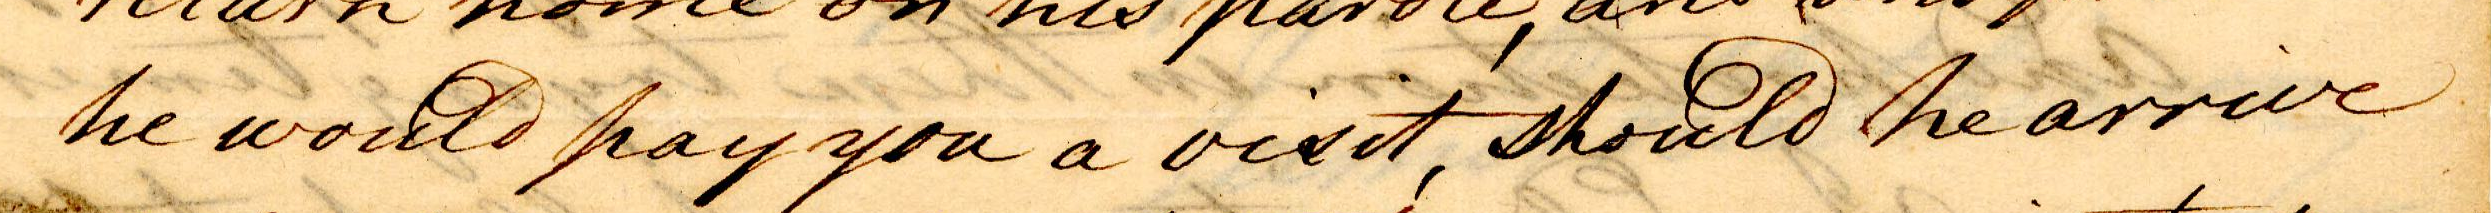he would pay you a visit, should he arrive
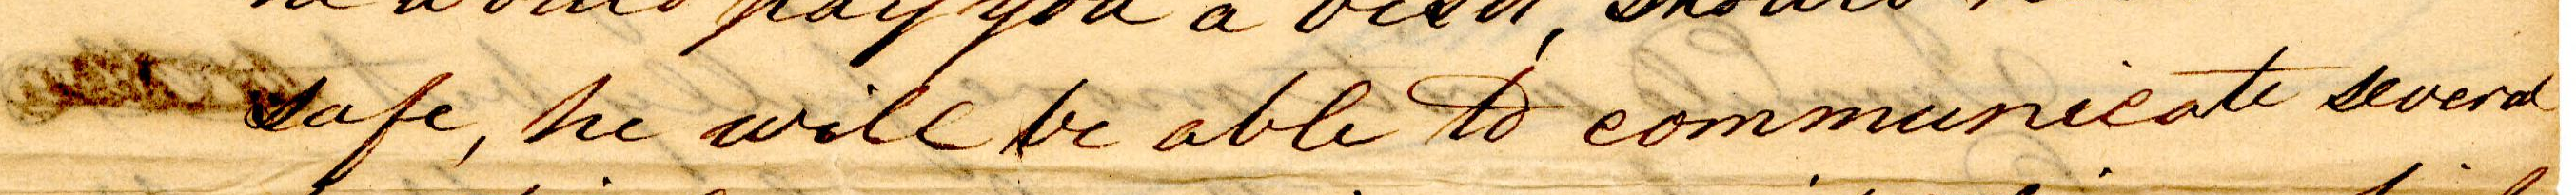safe, he will be able to communicate several
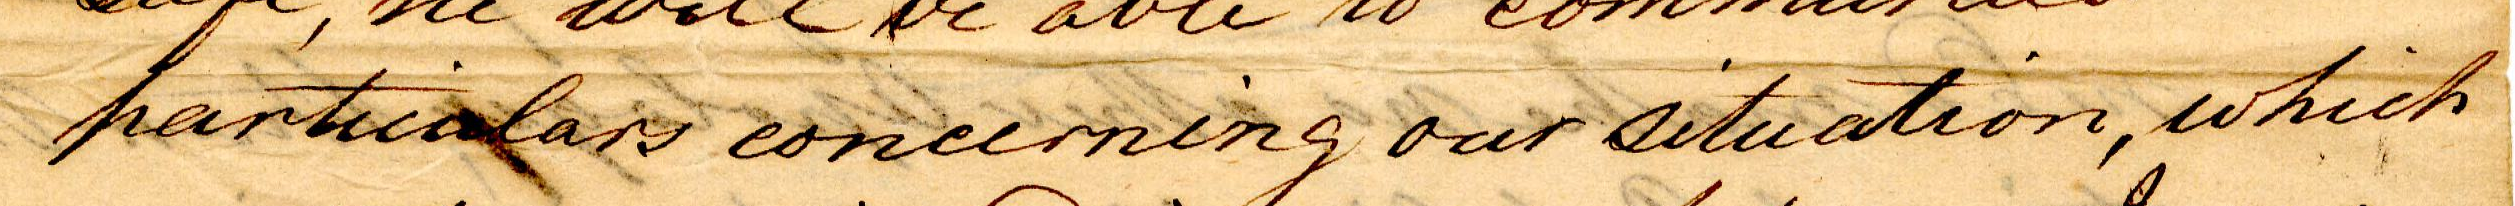particulars concerning our situation, which
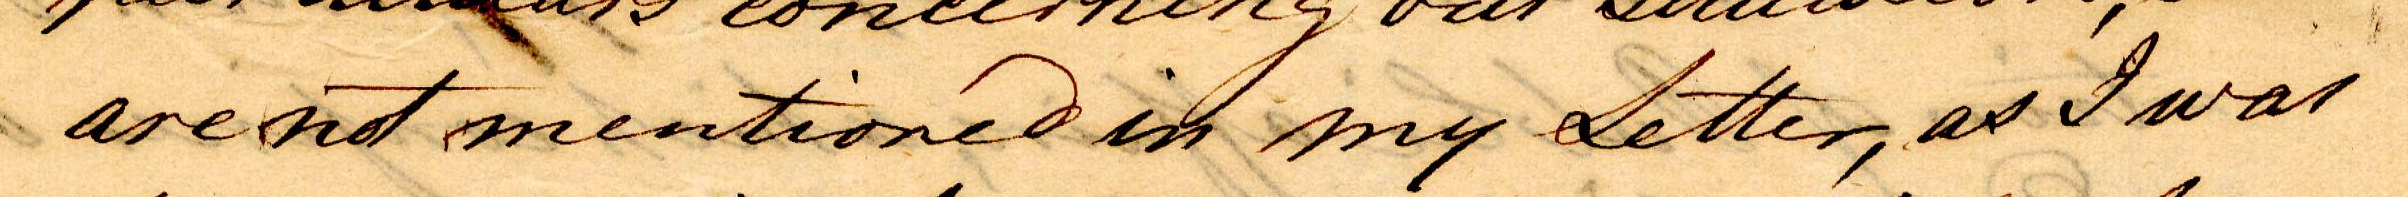are not mentioned in my Letter, as I was
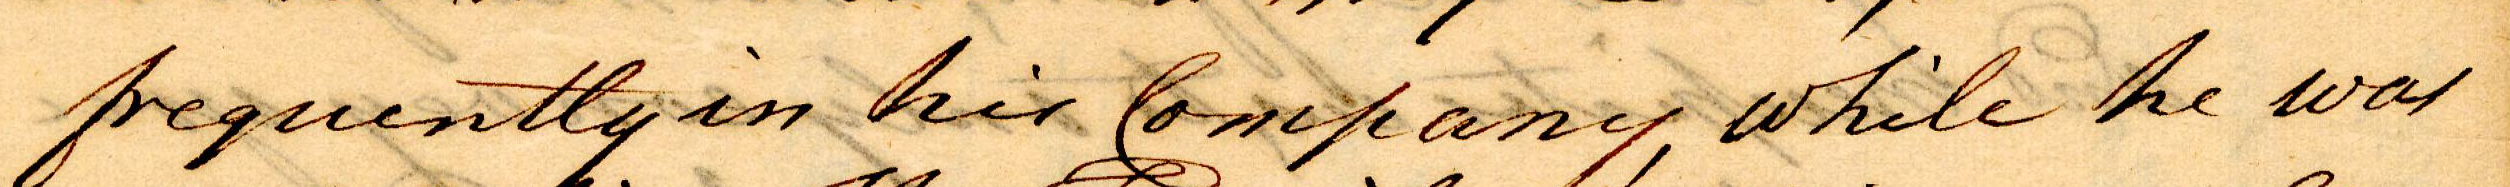frequently in his Company, while he was
